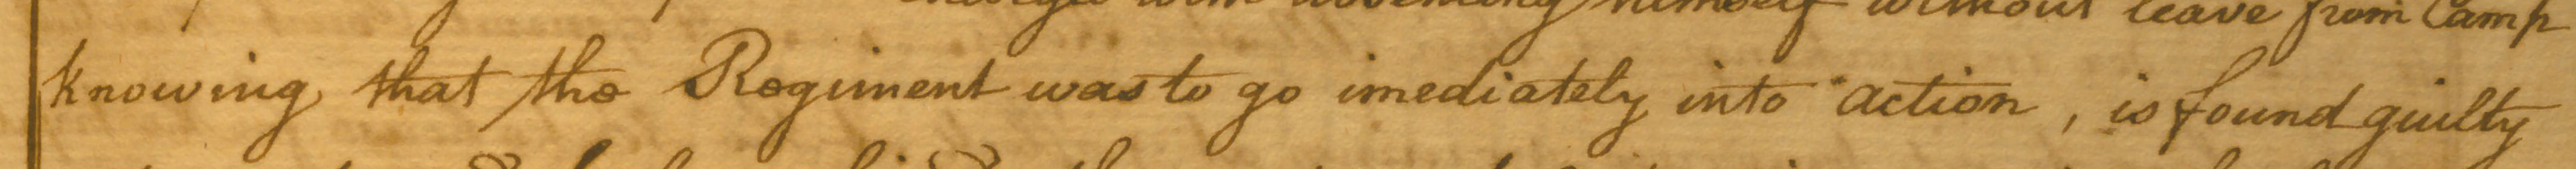knowing that the Regiment was to go imediately into action, is found guilty
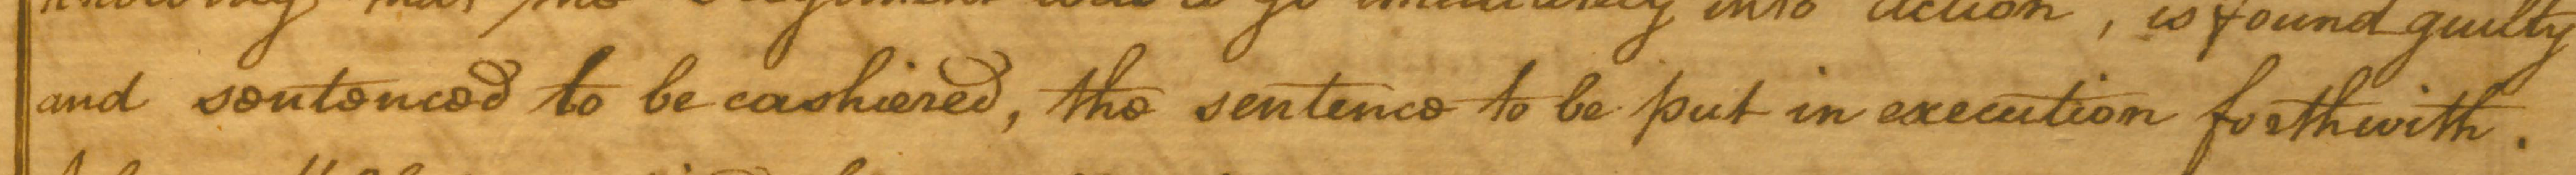and sentenced to be cashiered, the sentence to be put into execution forthwith.
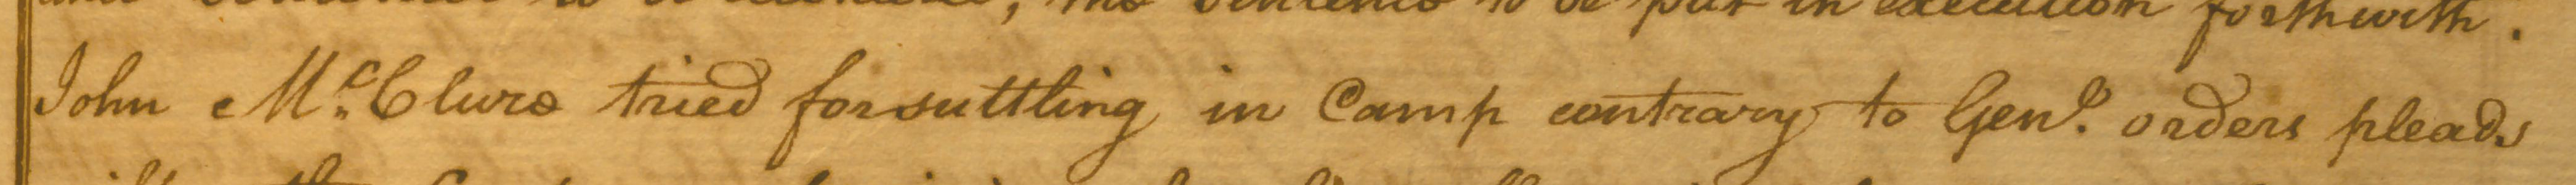John M^c.Clure tried for settling in Camp contrary to Gen^l. orders pleads
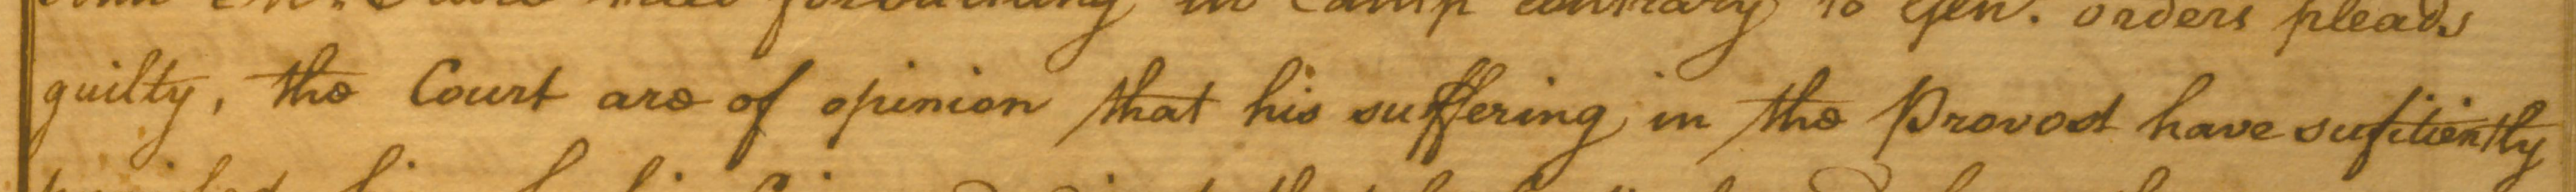guilty, the Court are of opinion that his suffering in the Provost have sufitiently
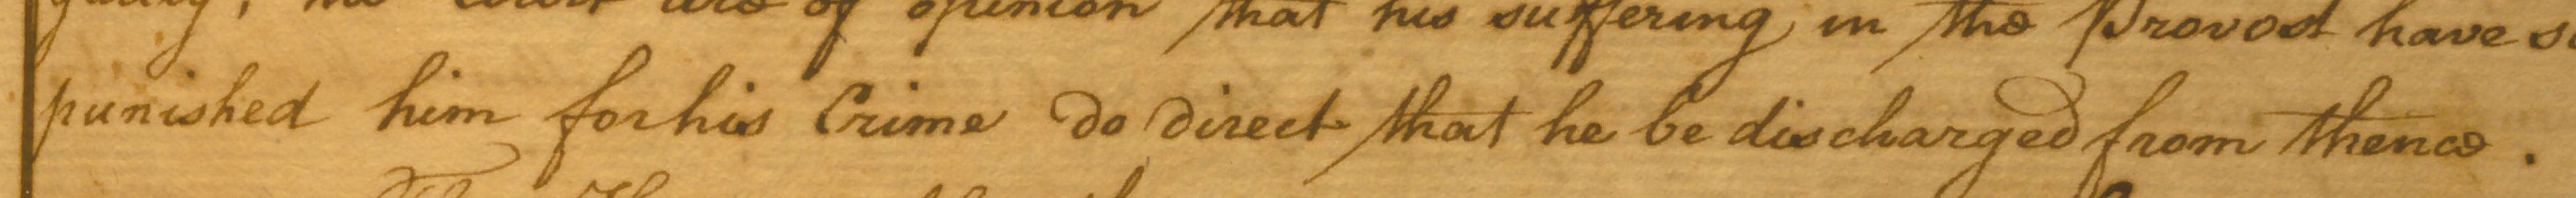punished him for his Crime do direct that he be discharged from thence.
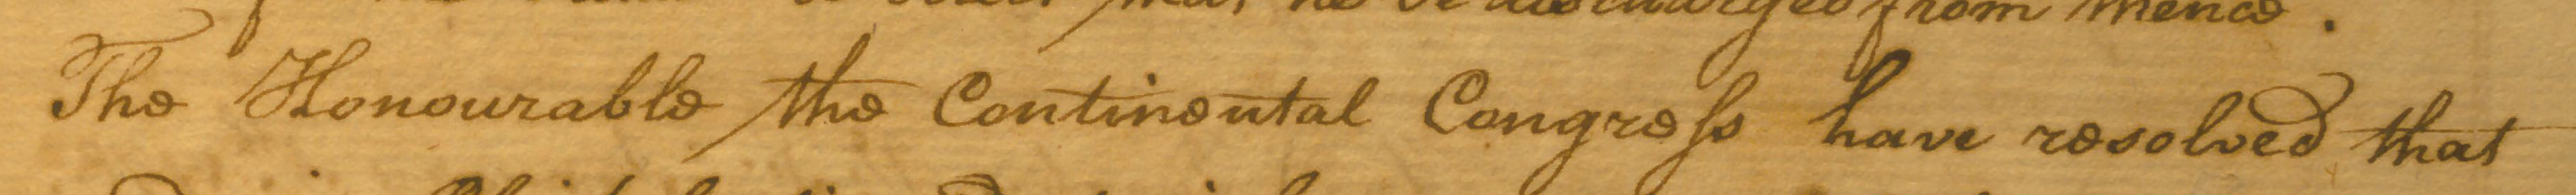The Honourable the Continental Congress have resolved that
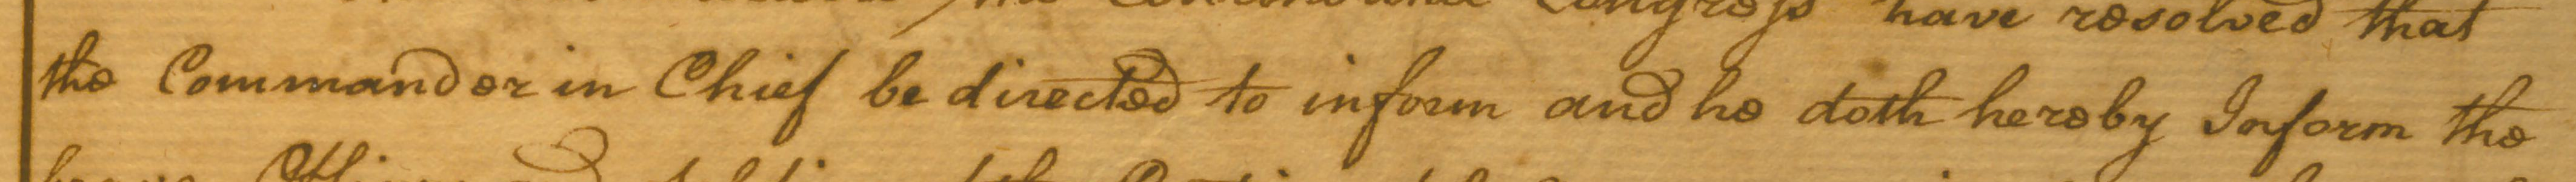the Commander in Chief be directed to inform and he doth hereby Inform the
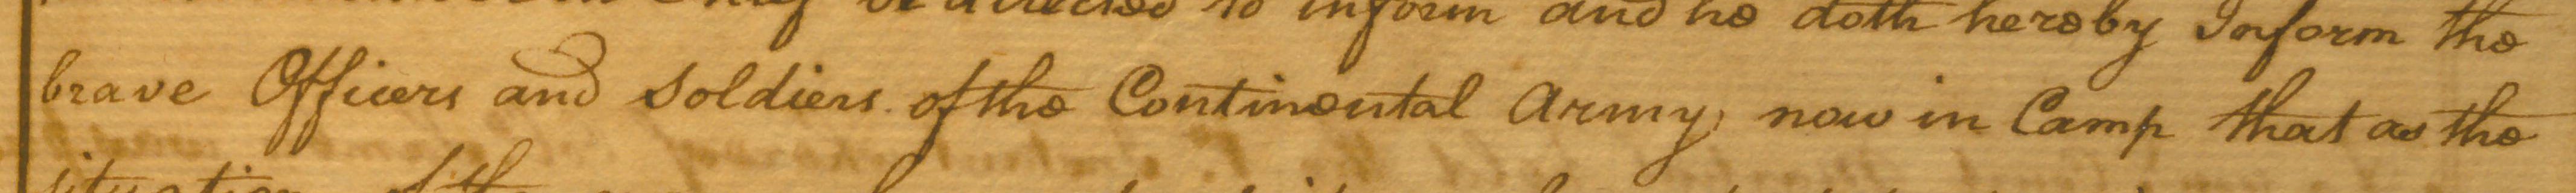brave Officers and Soldiers of the Continental Army now in Camp that as the
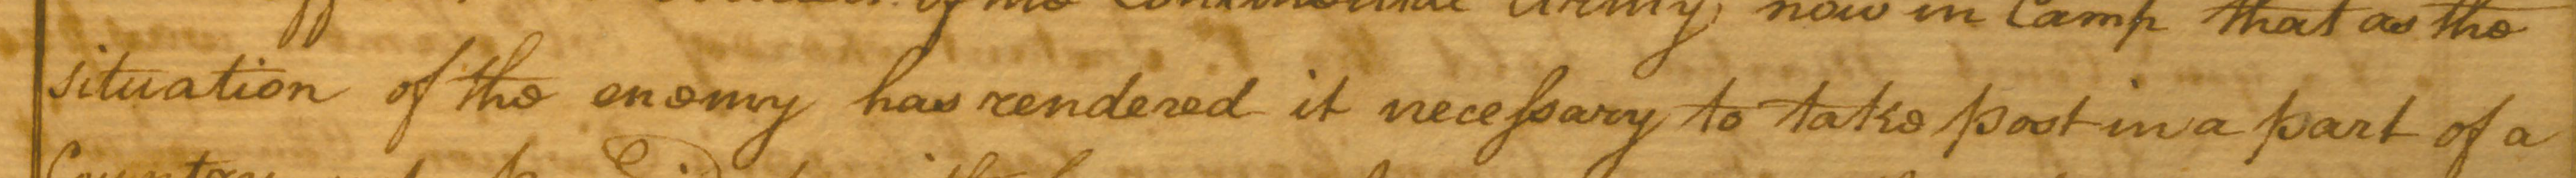situation of the enemy has rendered it necessary to take post in a part of a
